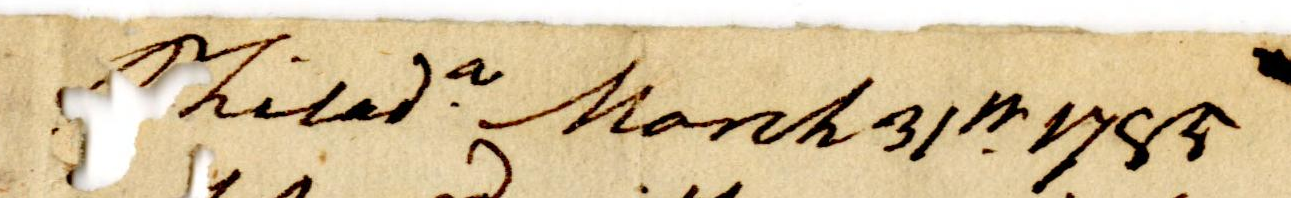Philad^a. March 31st. 1785
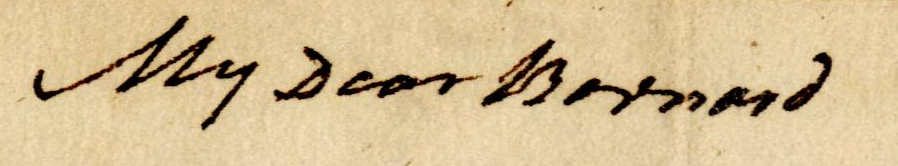My Dear Barnard
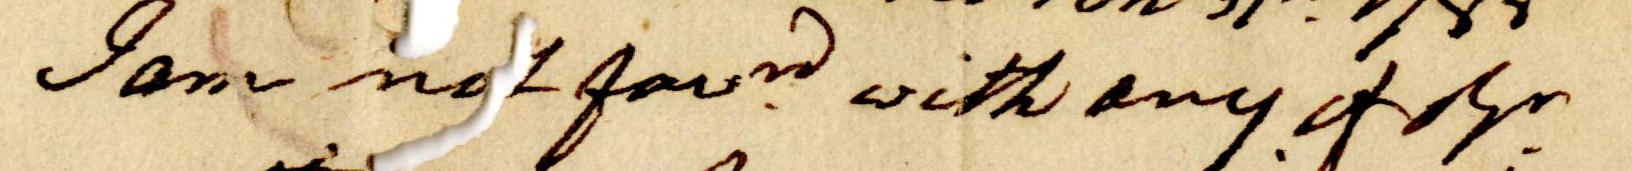I am not fav^rd with any of Y^r
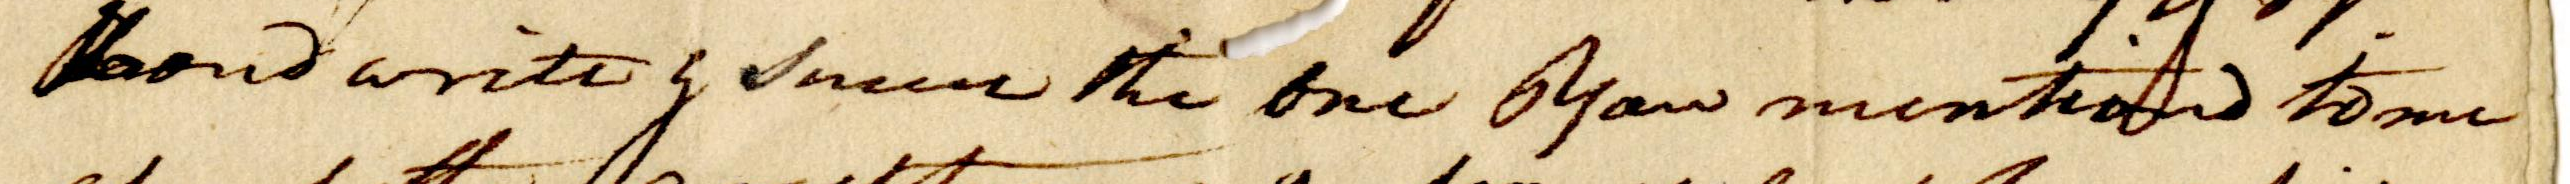hand write^g since the one you mentiond to me
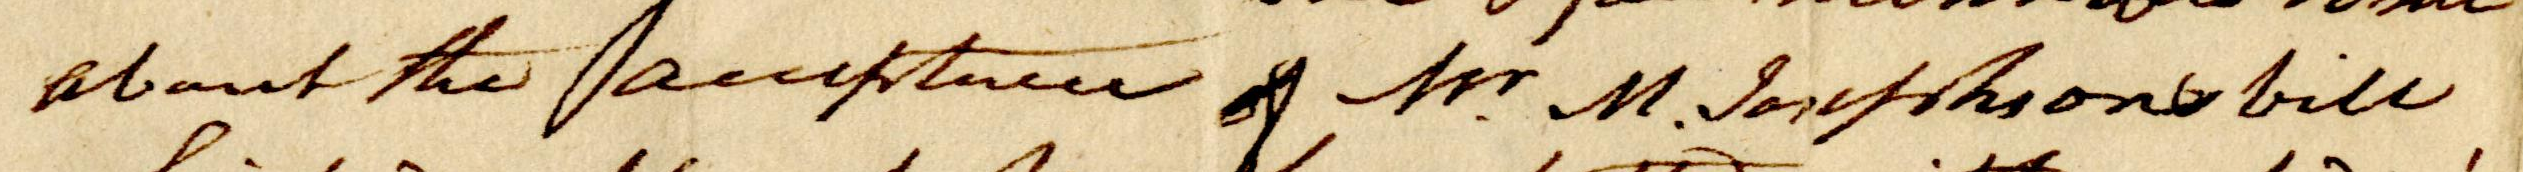about the acceptance of M^r M. Josephsons bill
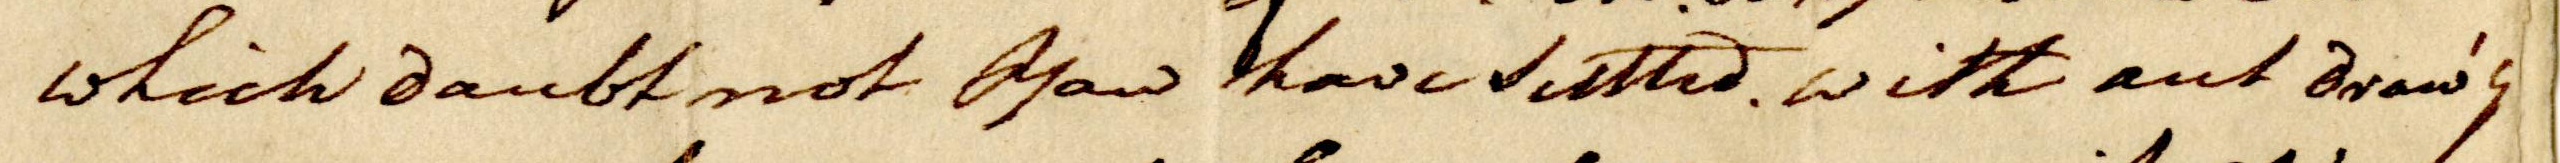which doubt not you have Settled with out draw'g
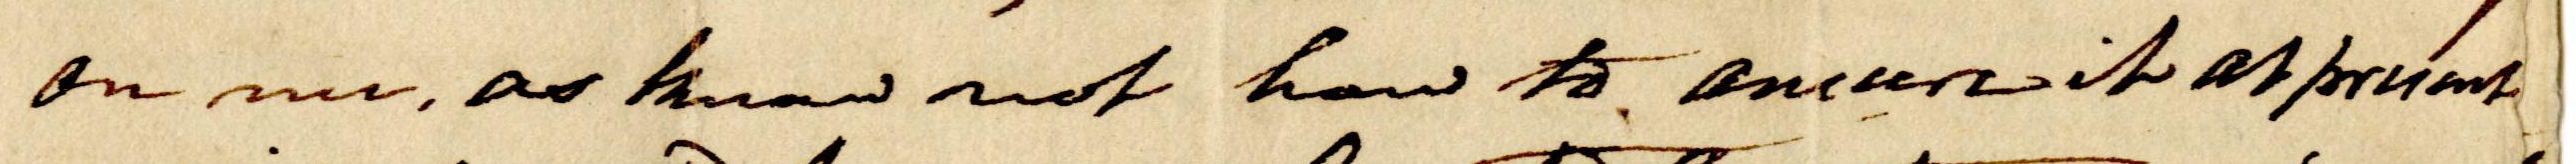on me, as know not have to answer it at present
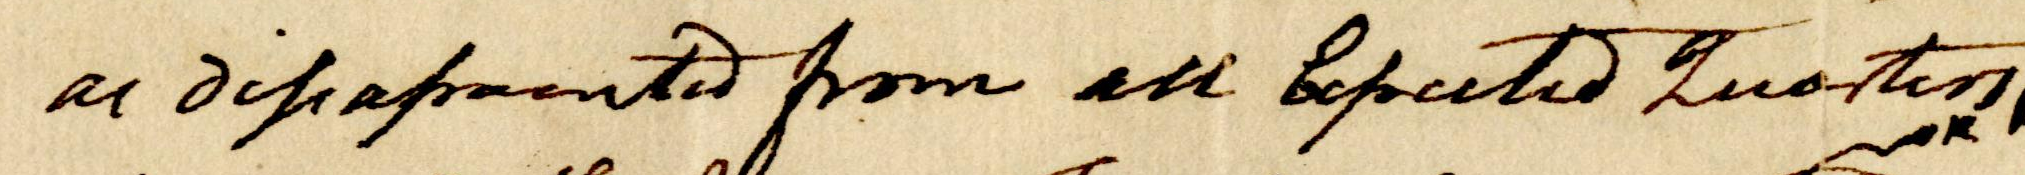as disappointed from all Expected Quarters h^'h a2
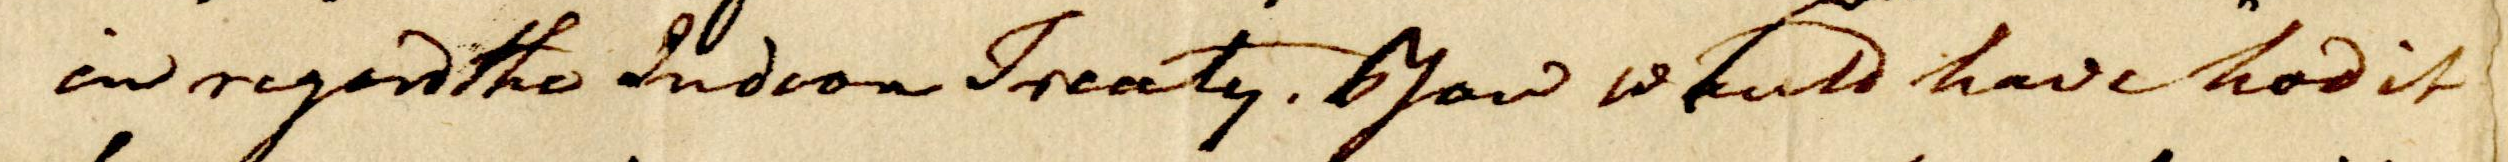in regard the Indian Treaty. You would have had it
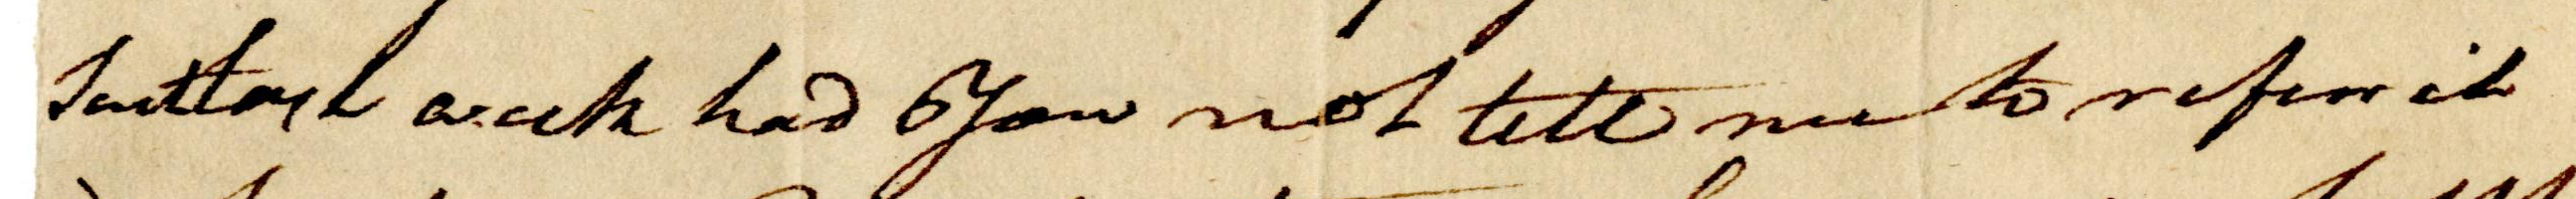Suttoch week had you not tell me to referr it
